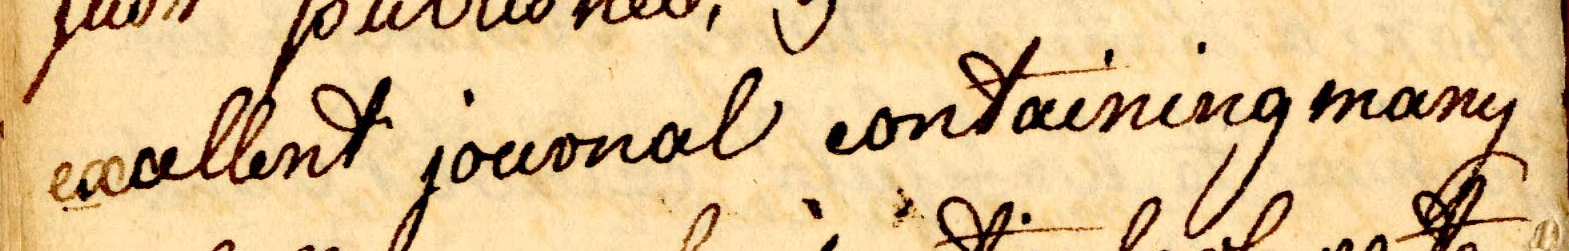excellent journal containing many
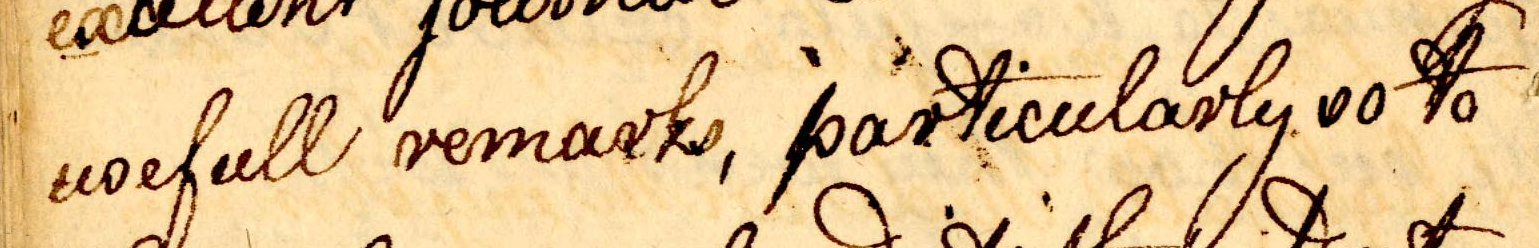usefull remarks, particularly so to
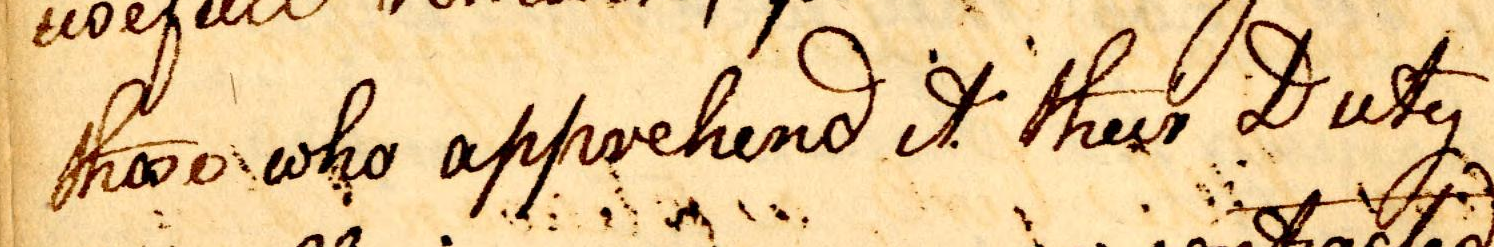those who apprehend it their Duty
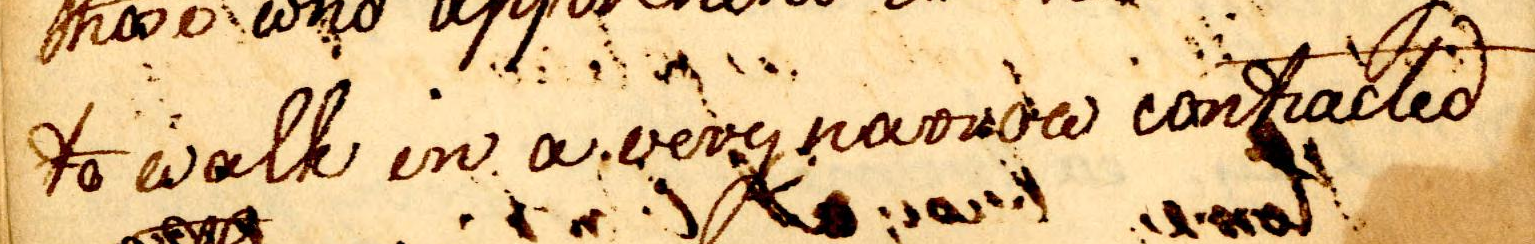to walk in a very narrow contracted
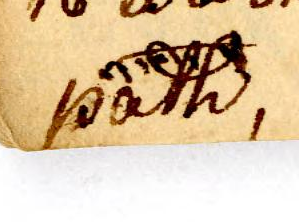path,
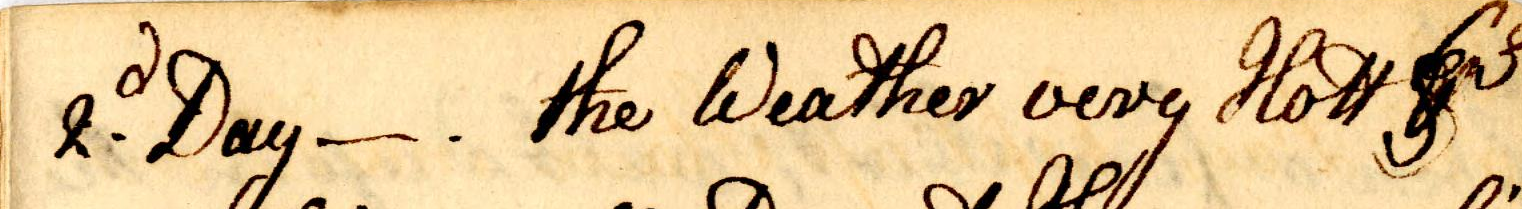2^d. Day- the Weather very Hott &
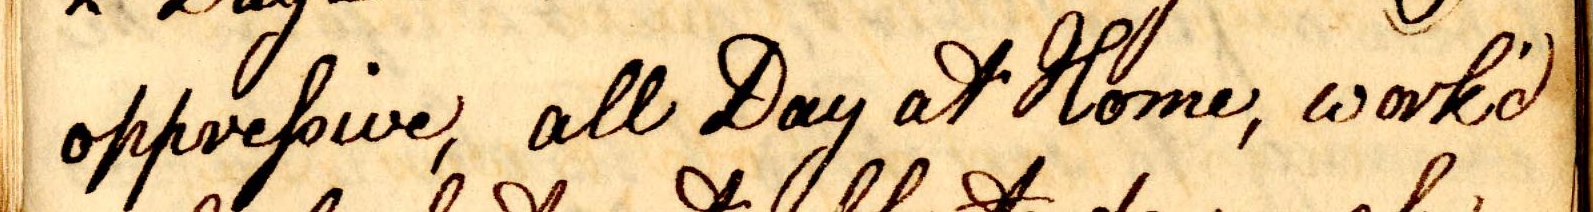oppressive, all Day at Home, work'd
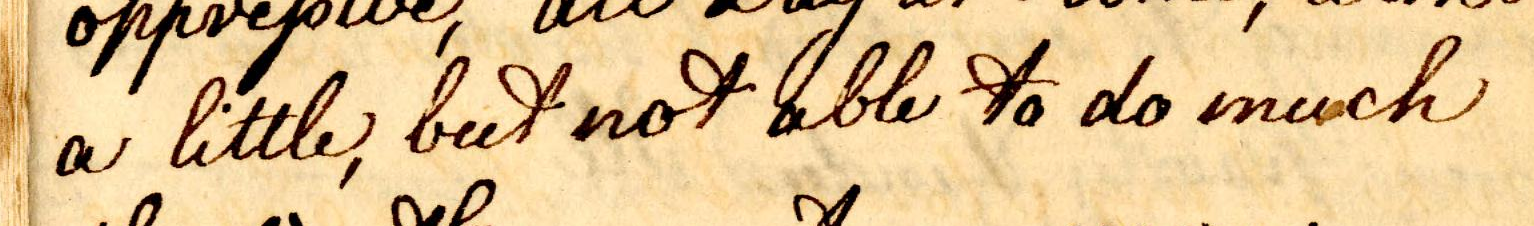a little, but not able to do much
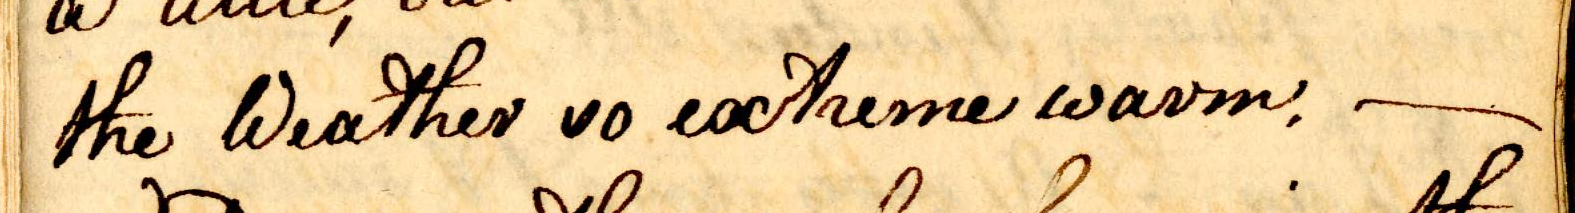the Weather so extreme warm.-
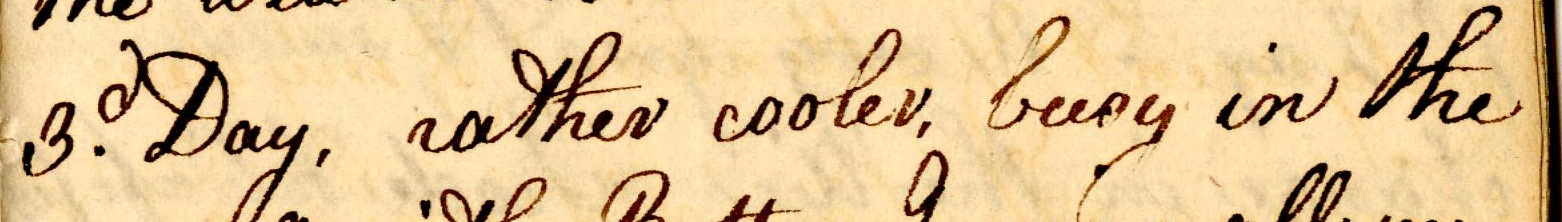3^d. Day, rather cooler, busy in the
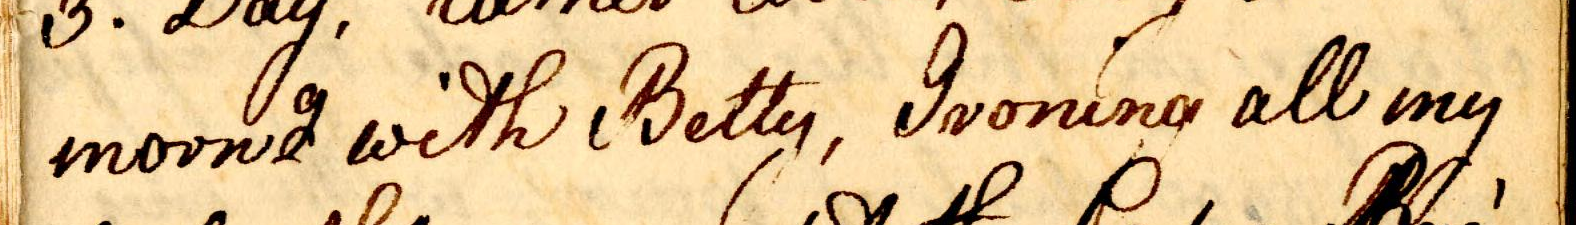morn^g with Betty, Ironing all my
